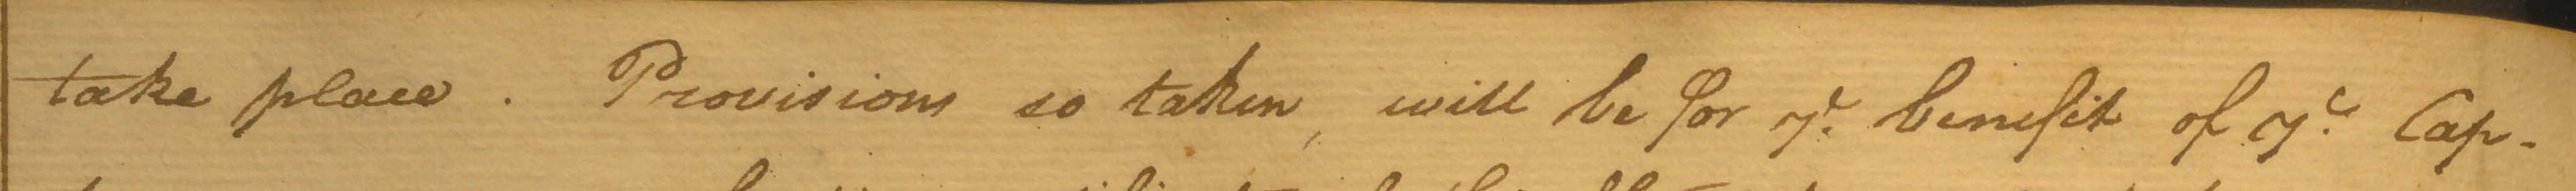take place. Provisions so taken will be for y^e. benefit of y^e. Cap-
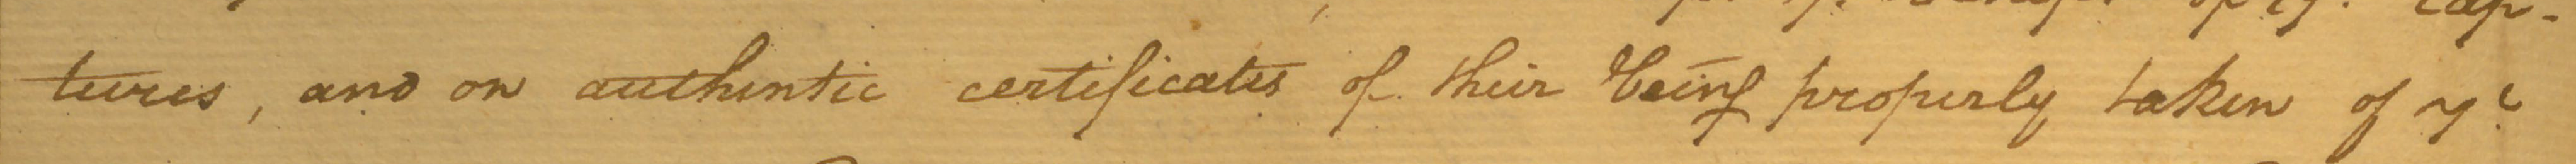tures, and on authentic certificates of their being properly taken of y^e
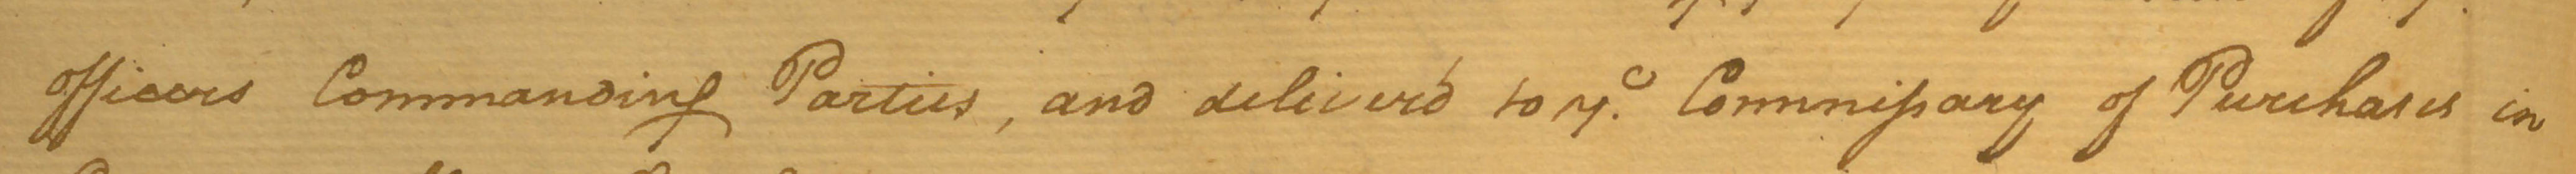officers Commanding Parties, and deliver'd to y^e. Commissary of Purchases in
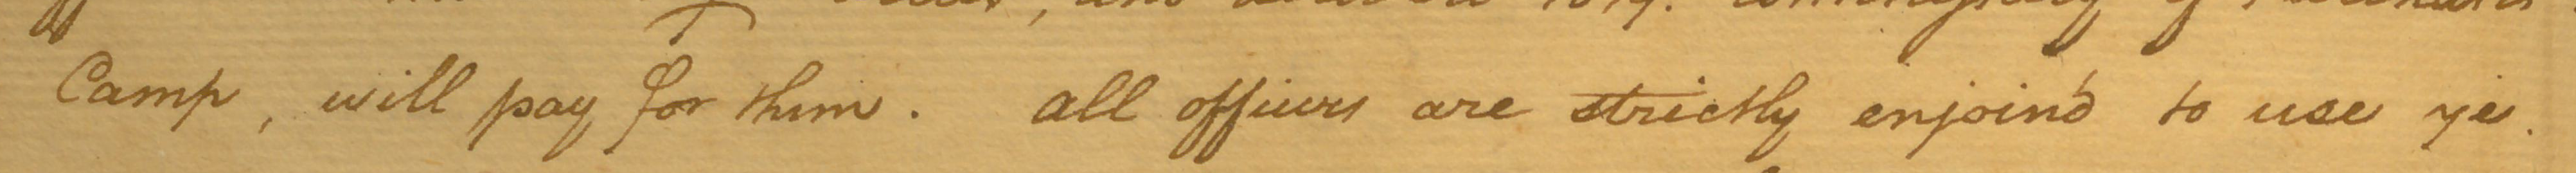Camp, will pay for them. All officers are strictly enjoin'd to use ye
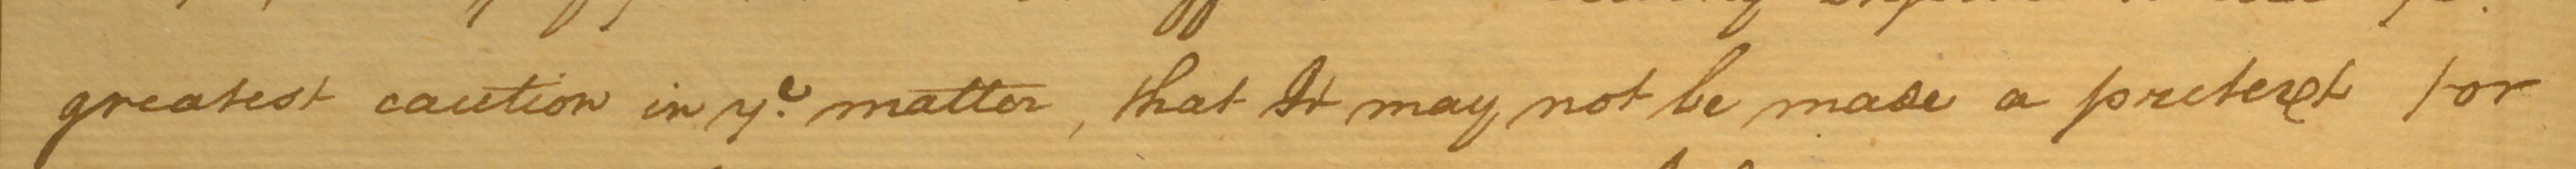greatest caution in y^e. matter, that It may not be made a pretext for
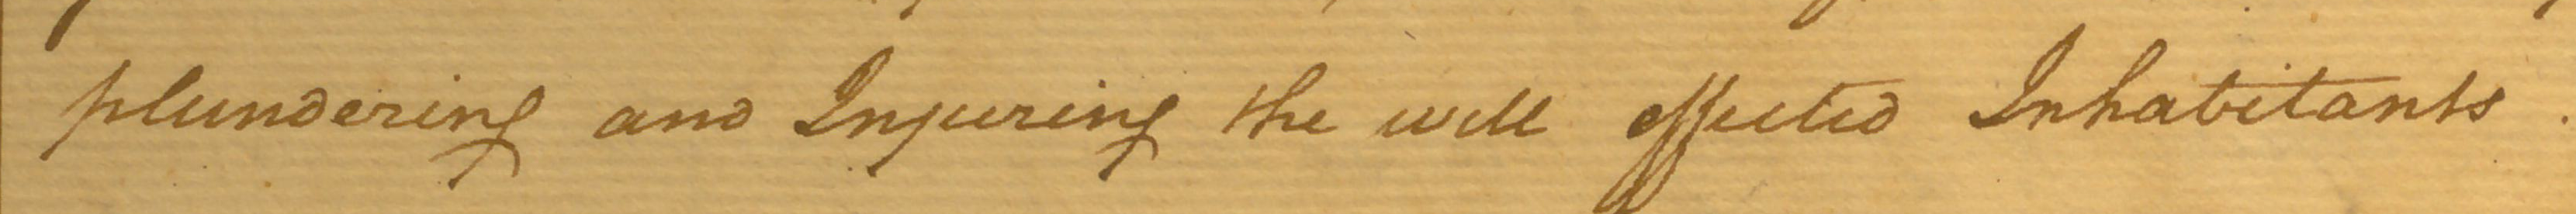plundering and Injuring the well effected Inhabitants
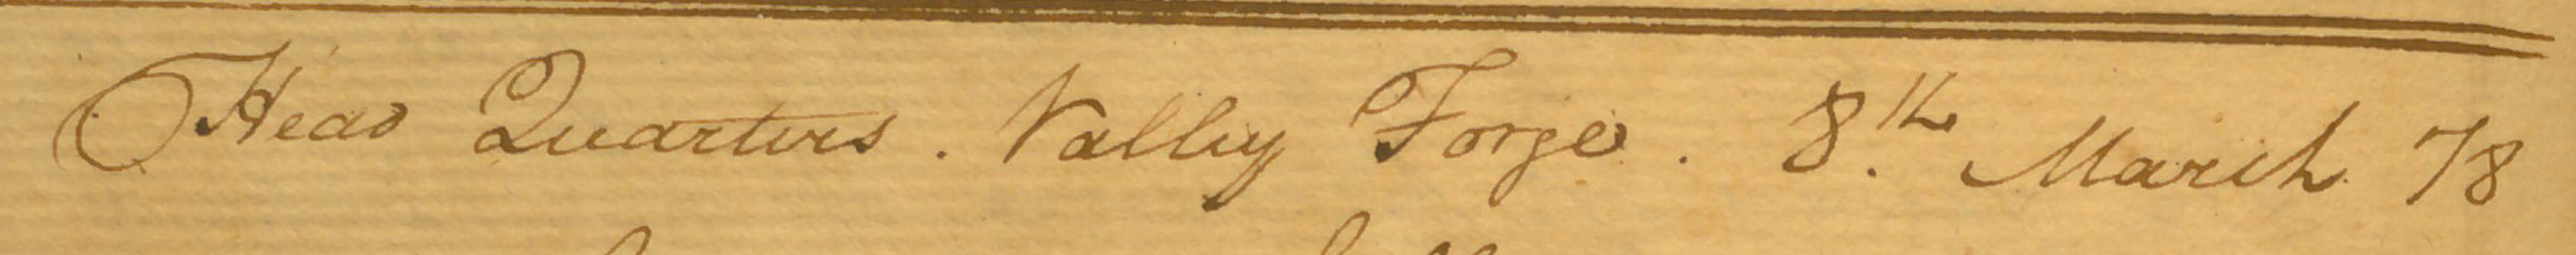Head Quarters. Valley Forge. 8^th. March 78
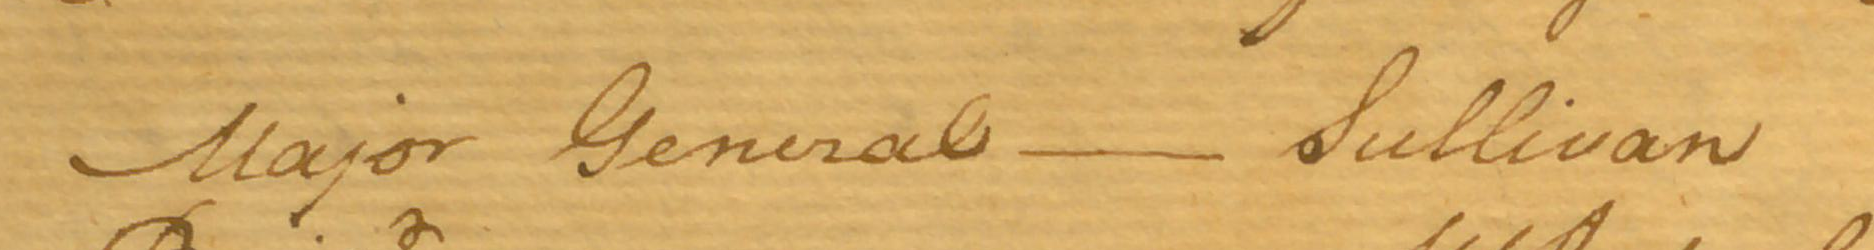Major General- Sullivan
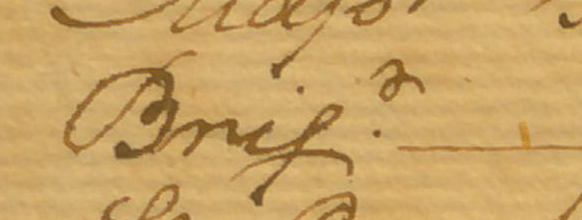Brig^r.-
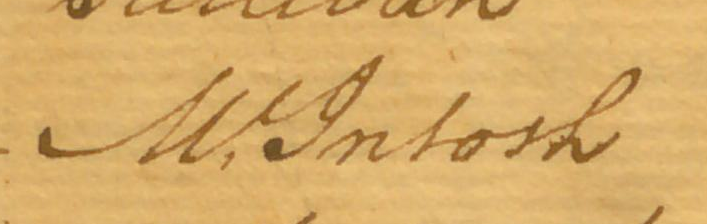M^c.Intosh
